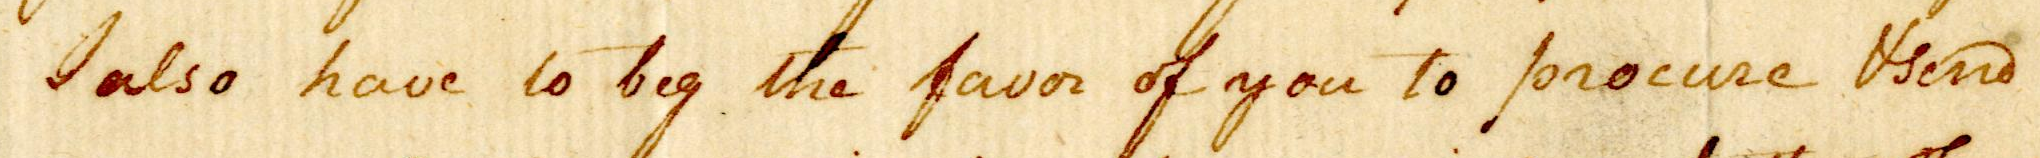I also have to beg the favor of you to procure & send
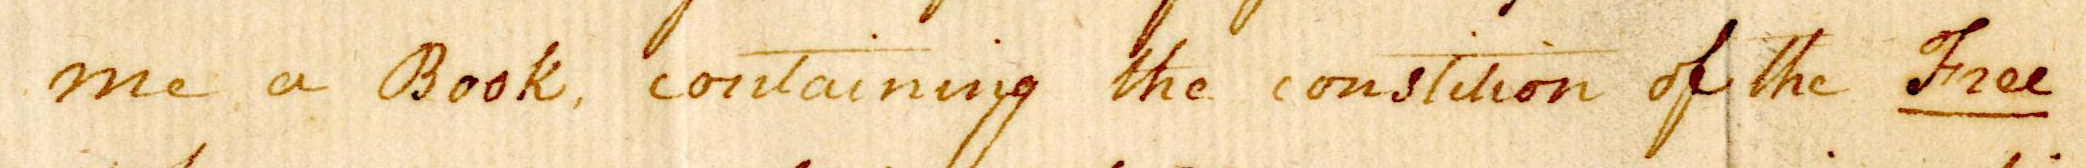me a Book, containing the constition of the Free
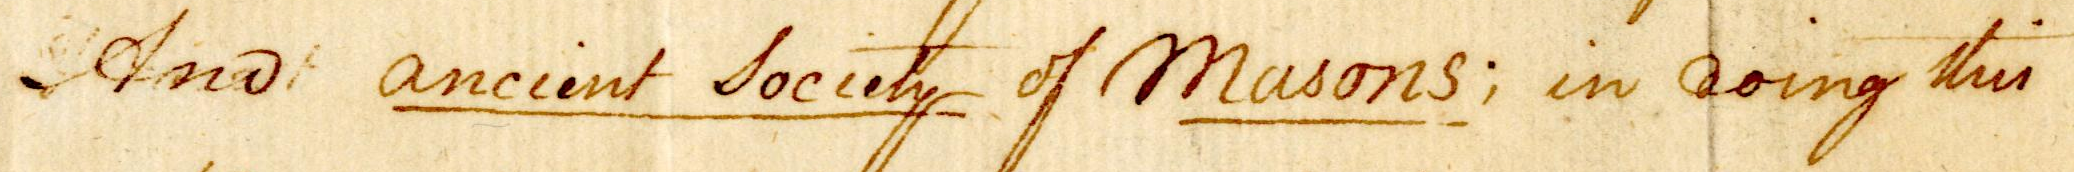And ancient Society of Mansons; in doing this
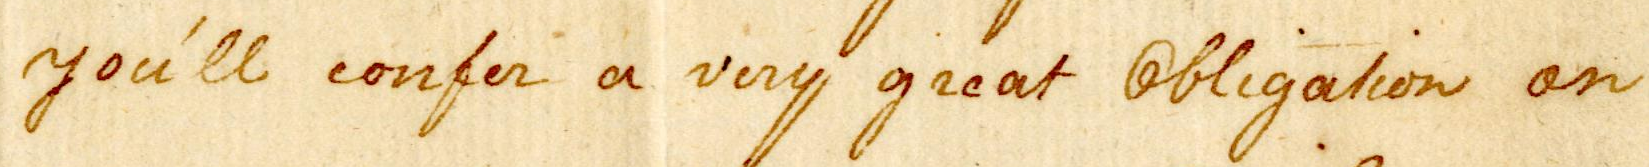you'll confer a very great obligation an
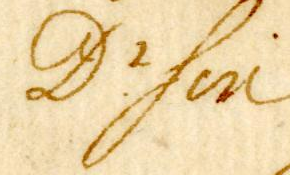D^r Sir
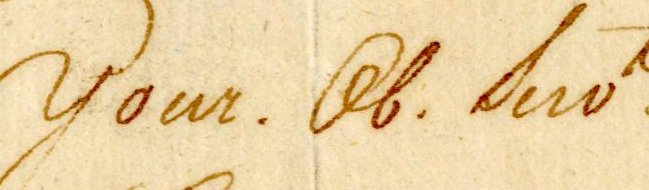your Ob. Serv^t
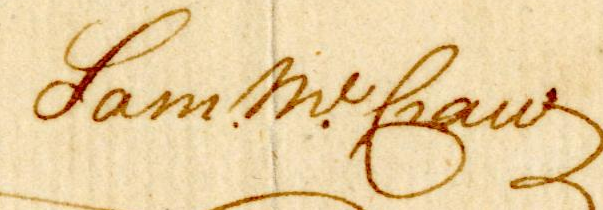Sam M^c.Caw
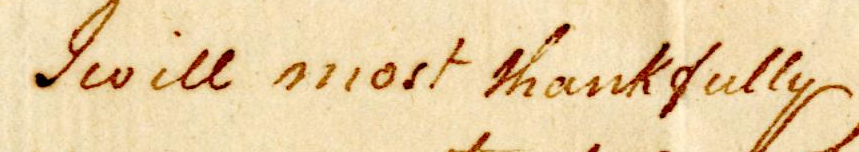I will most thankfully
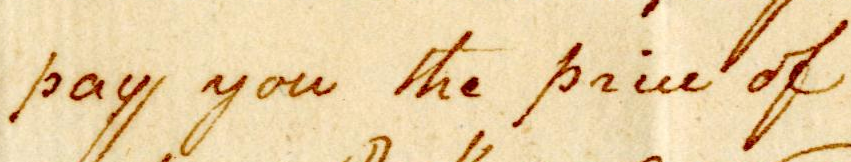pay you the price of
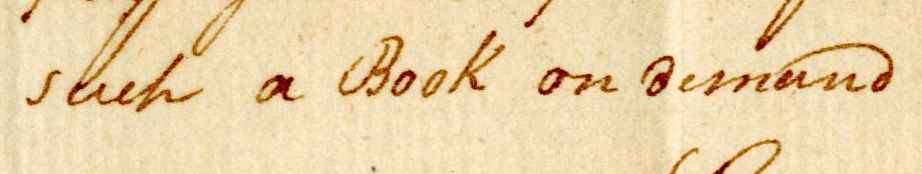such a Book on Demand
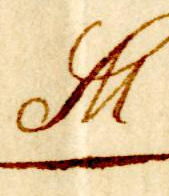M
